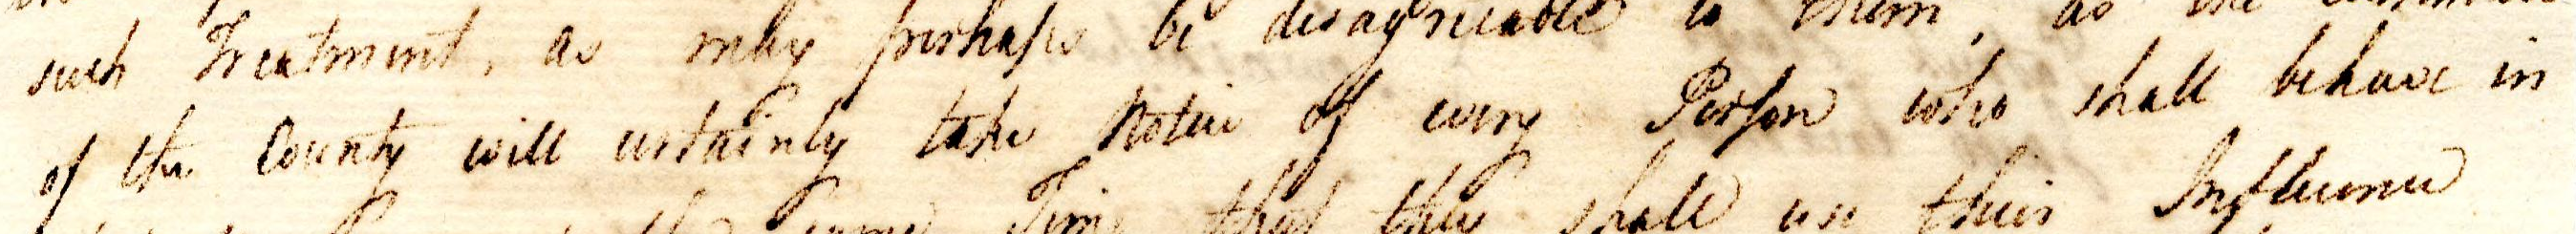of the County will certainly take notice of every Person who shall behave in
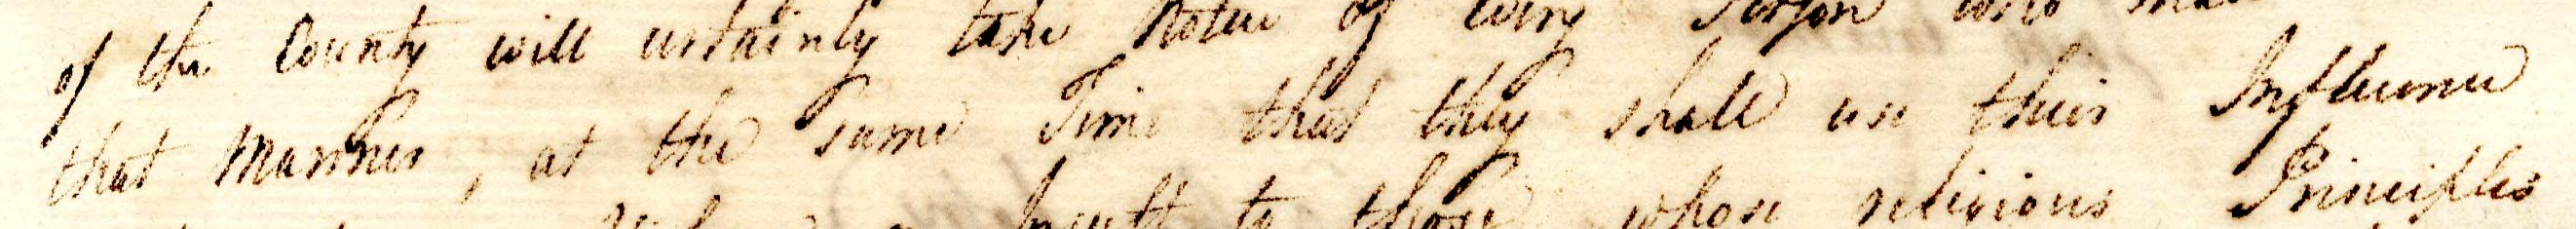that Manner, at the same Time that they shall use their Influence
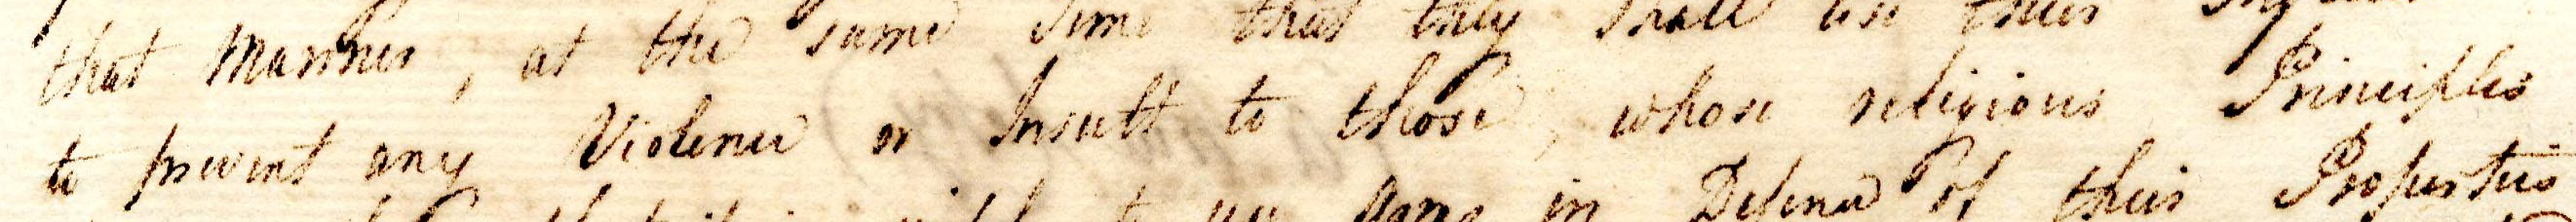to prevent any Violence or Insult to those, whose religious Principles
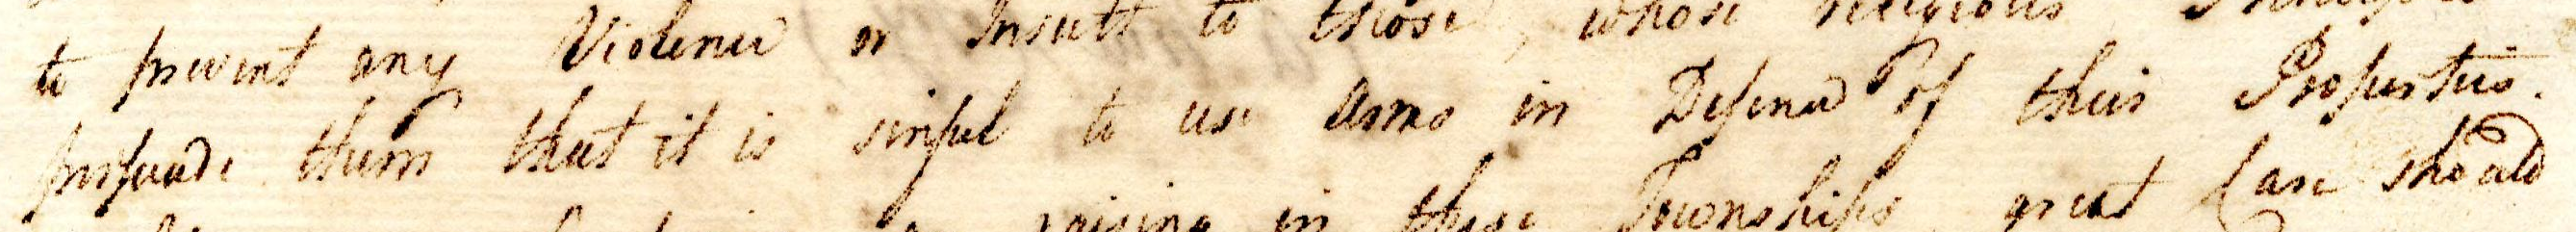persuade them that it is sinful to use Arms in Defence of their Properties.
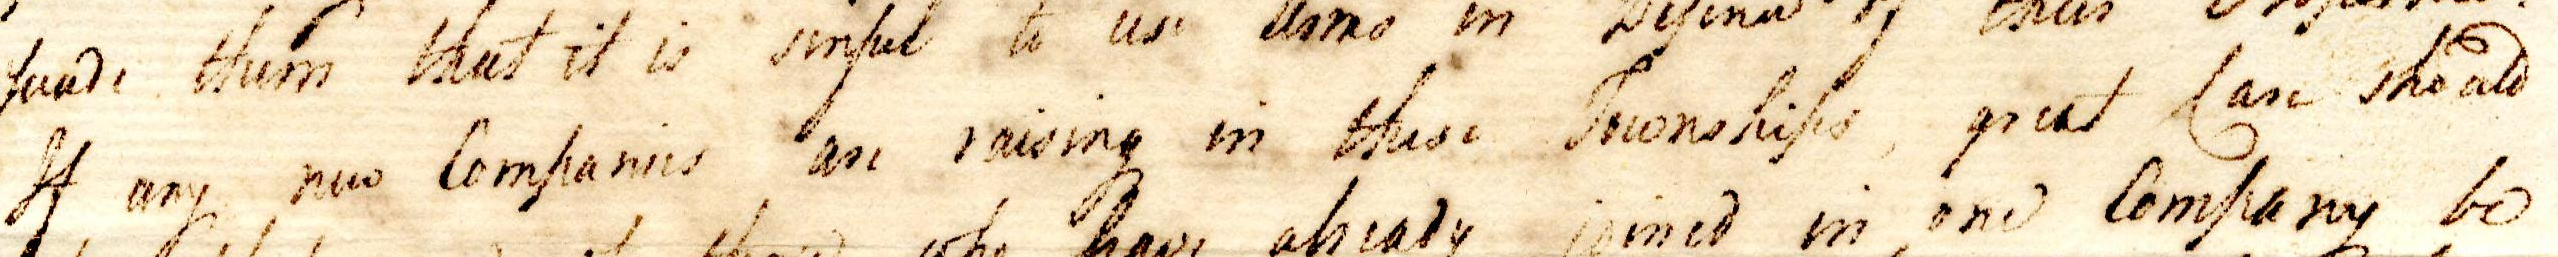If any new Companies are raising in these Townships, great Care should
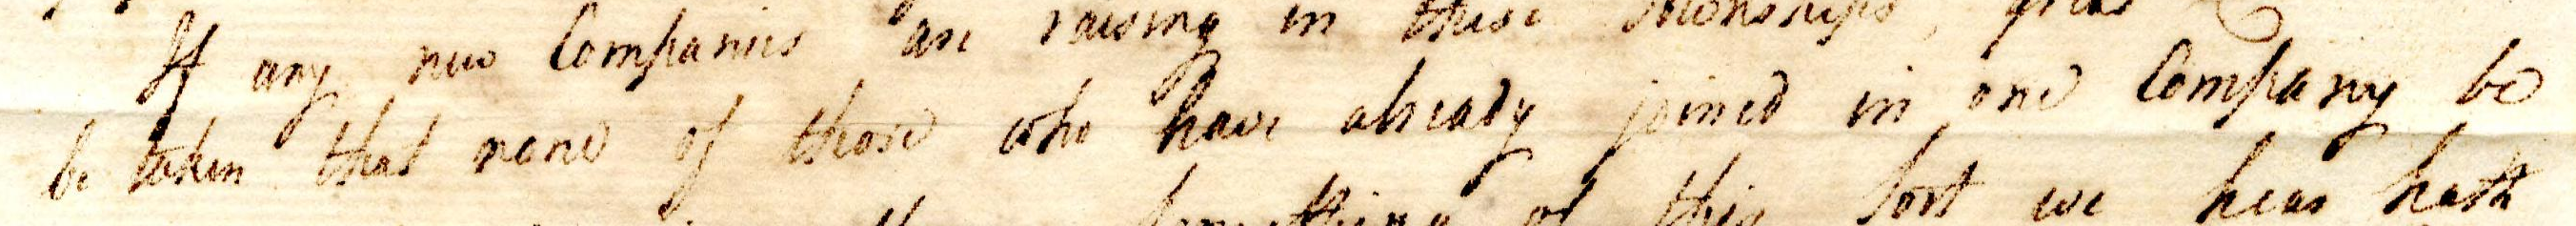be taken that none of those who have already joined in one Company be
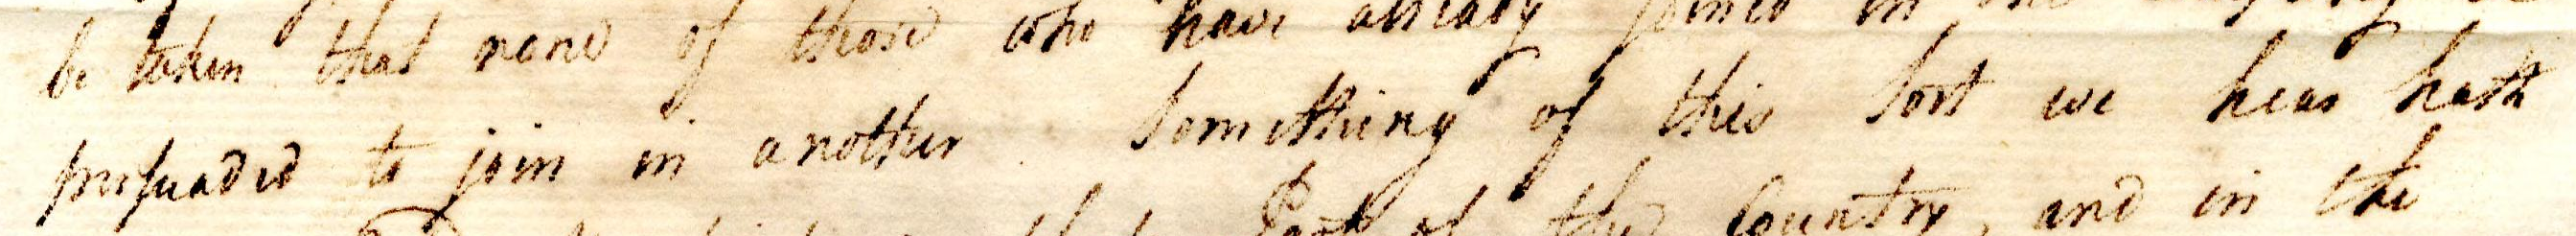persuaded to join in another. Something of this sort we hear hath
